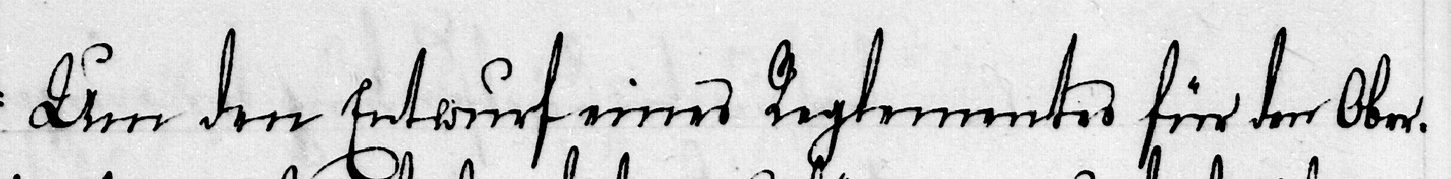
Um den Entwurf eines Reglementes für den Ober¬
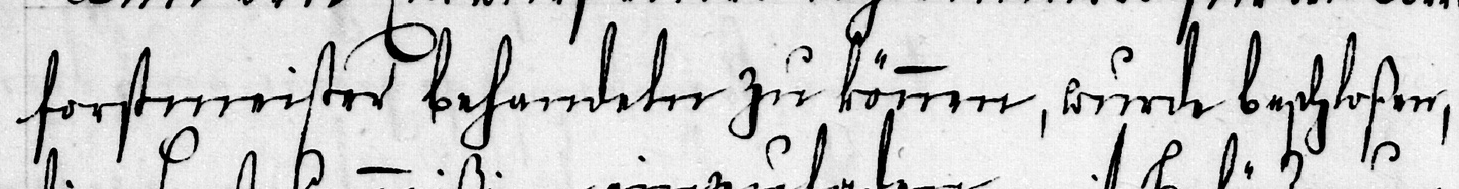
forstmeister behandeln zu können, wurde beschloßen,
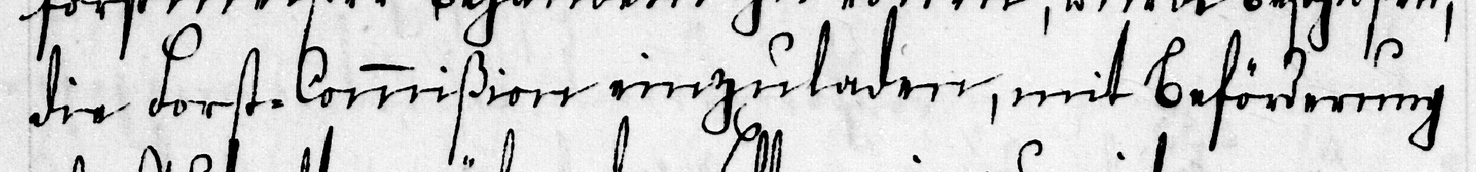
die Forst-Commißion einzuladen, mit Beförderung
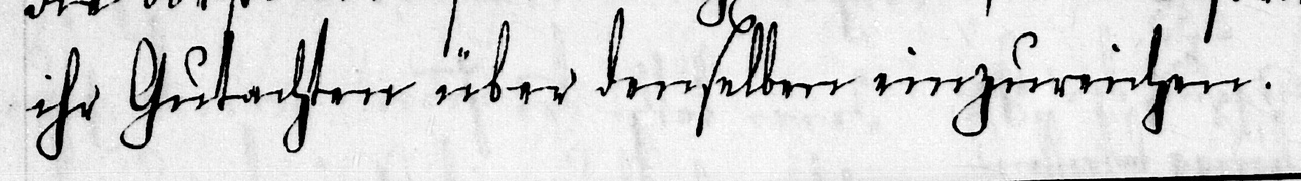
ihr Gutachten über denselben einzureichen.
